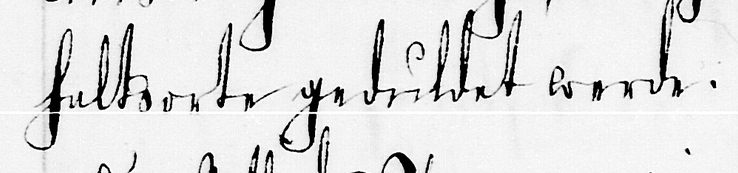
haltsorte geduldet werde.
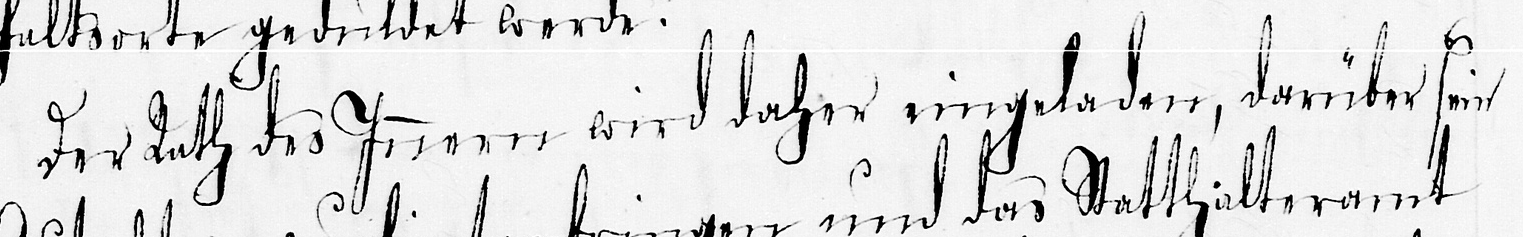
Der Rath des Innern wird daher eingeladen, darüber sein
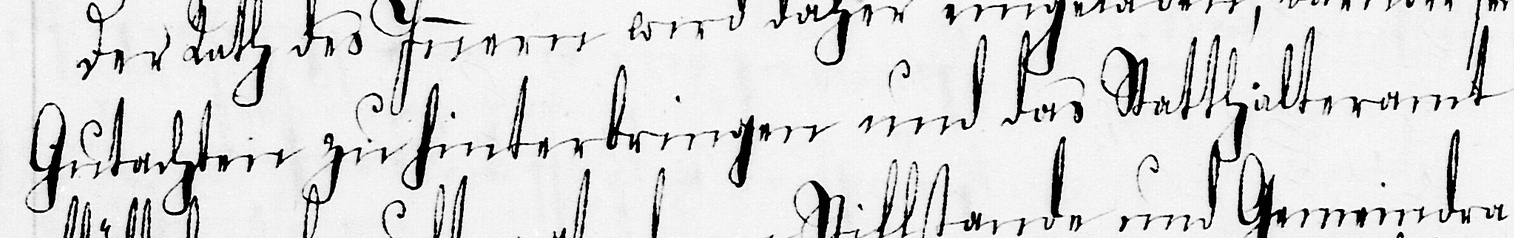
Gutachten zu hinterbringen und das Statthalteramt
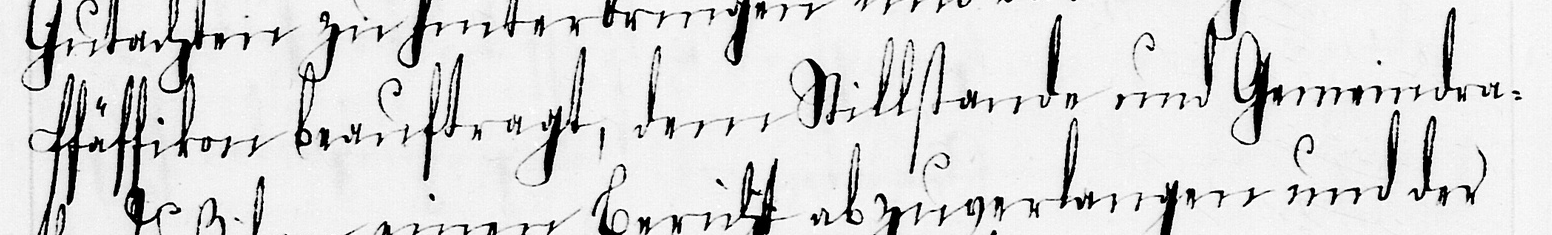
Pfäffikon beauftragt, dem Stillstande und Gemeindra¬
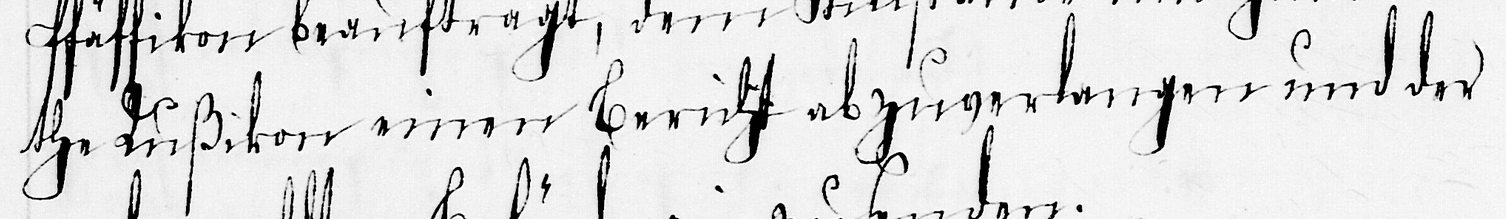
the Rußikon einen Bericht abzuverlangen und der
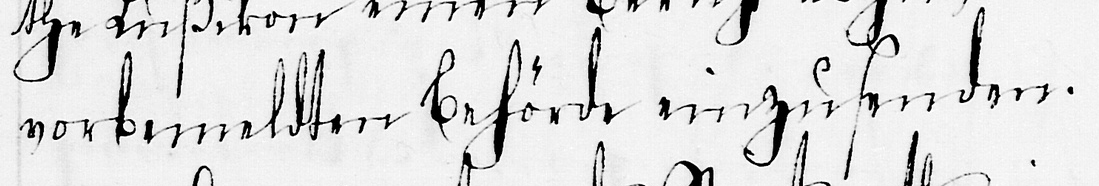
vorbemeldten Behörde einzusenden.
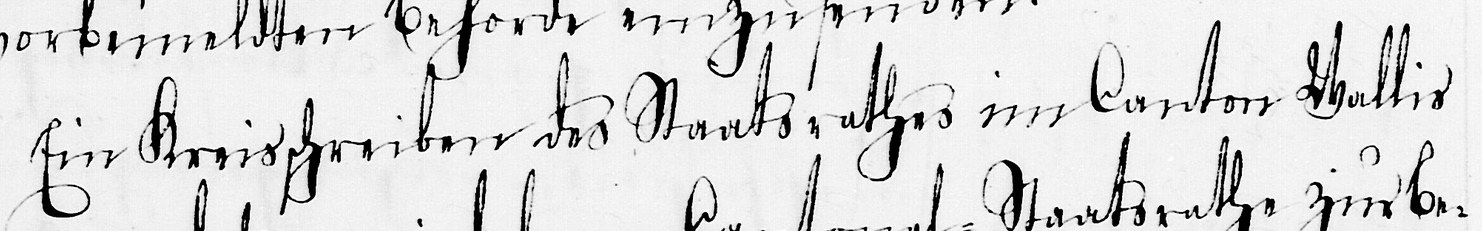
Ein Kreisschreiben des Staatsrathes im Canton Wallis
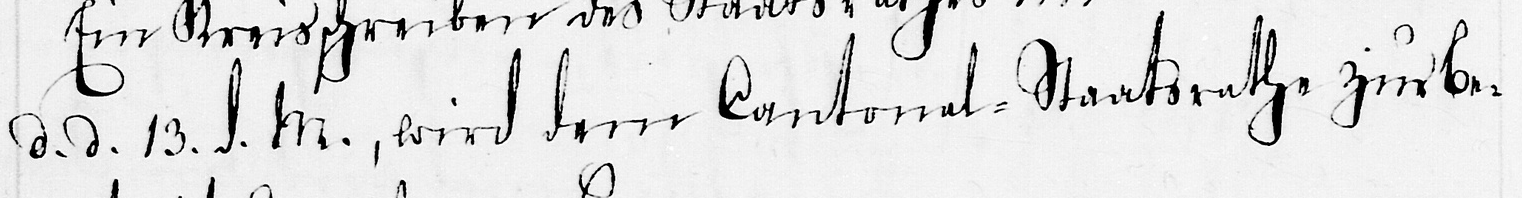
d. d. 13. d. M., wird dem Cantonal-Staatsrathe zur Be¬
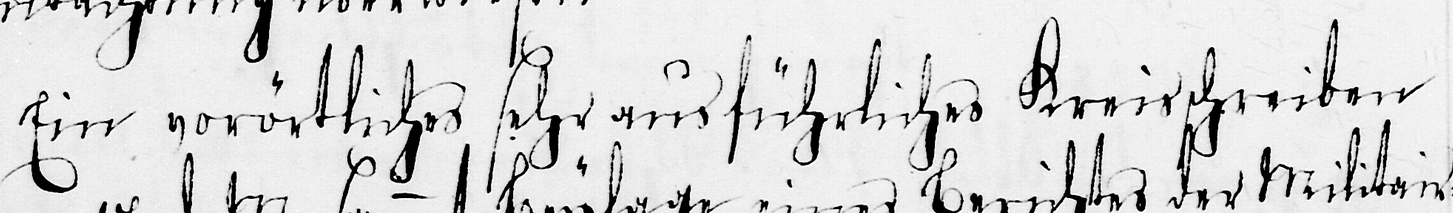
Ein vorörtliches sehr ausführliches Kreisschreiben
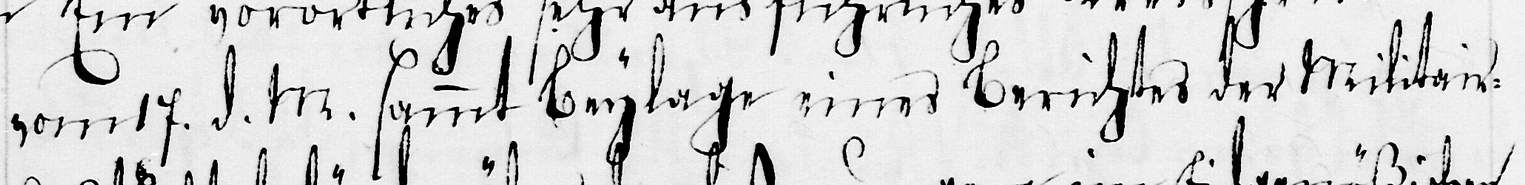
vom 17. d. M. sammt Beylage eines Berichtes der Militai¬
